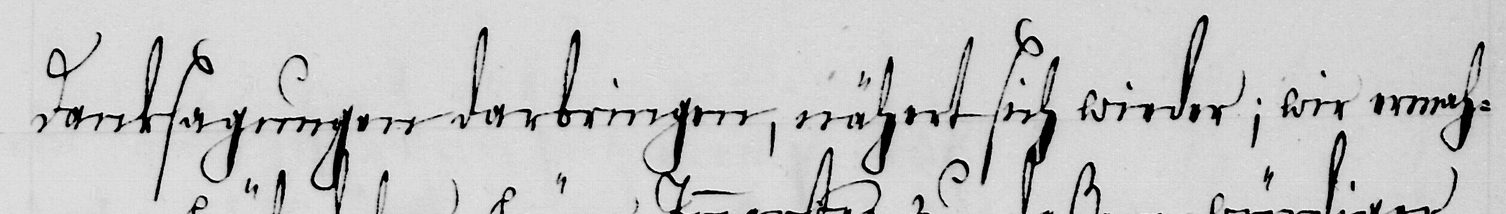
Danksagungen darbringen, nähert sich wieder; wir ermah¬
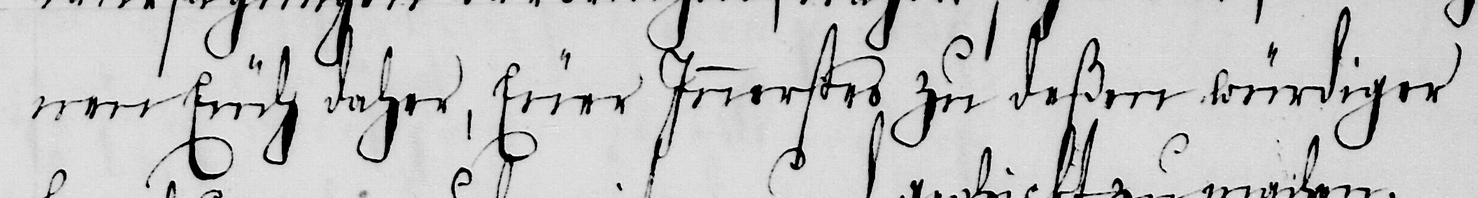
nen Euch daher, Euer Innerstes zu deßen würdiger
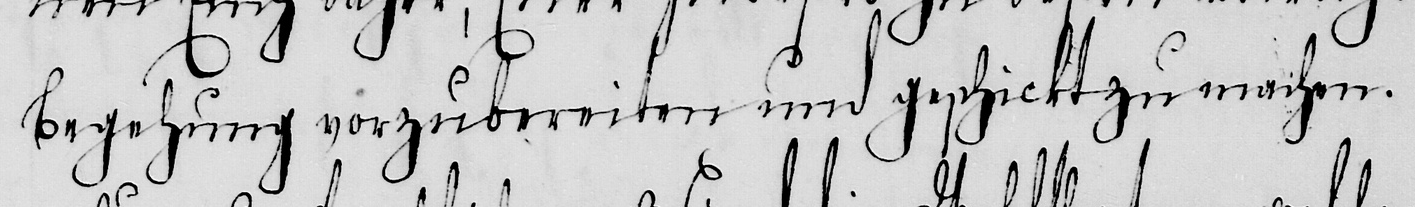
Begehung vorzubereiten und geschickt zu machen.
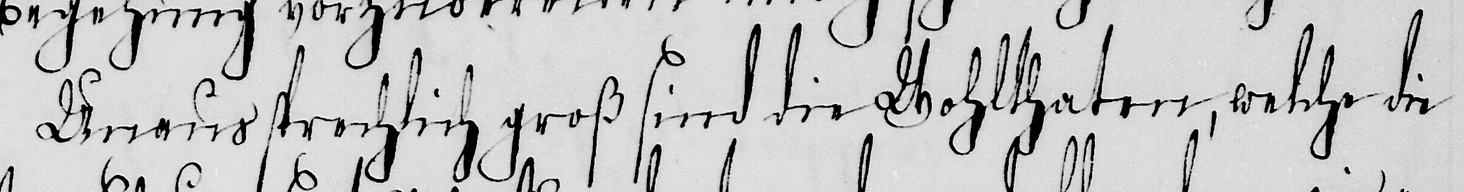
Unaussprechlich groß sind die Wohltaten, welche die
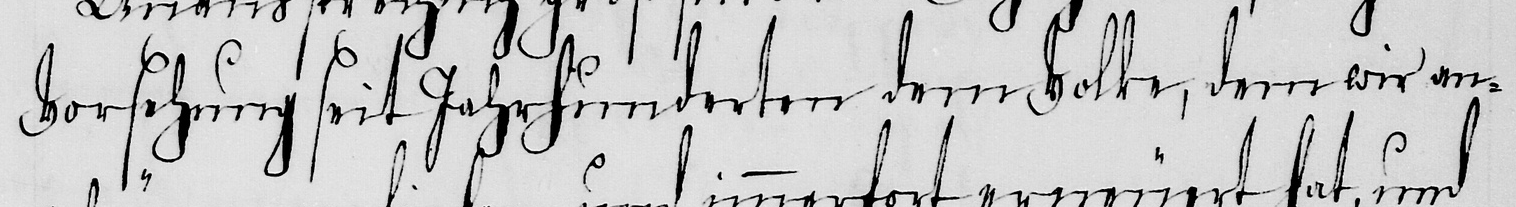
Vorsehung seit Jahrhunderten dem Volke, dem wir an¬
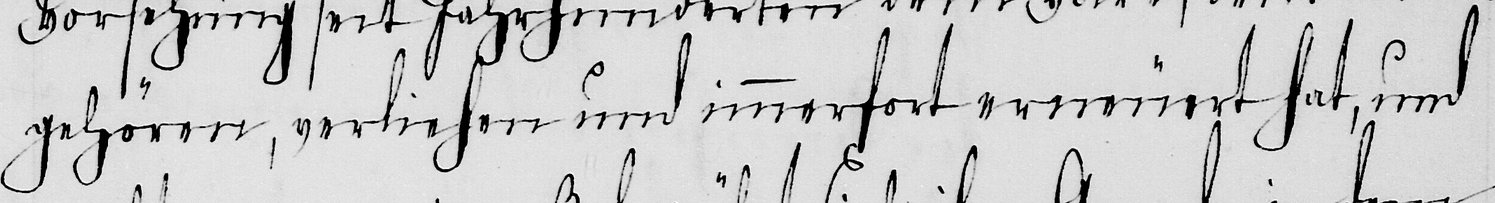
gehören, verliehen und immerfort erneuert hat, und
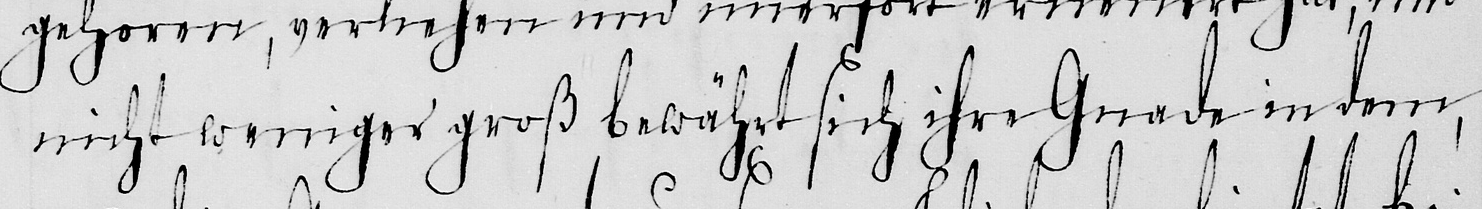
nicht weniger groß bewährt sich ihre Gnade in dem,
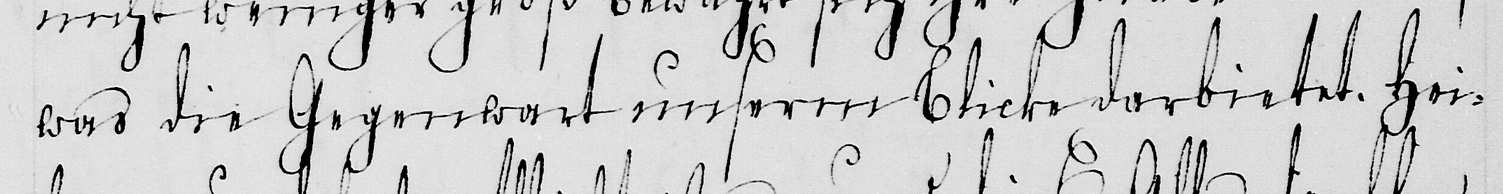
was die Gegenwart unserm Blicke darbietet. Hei¬
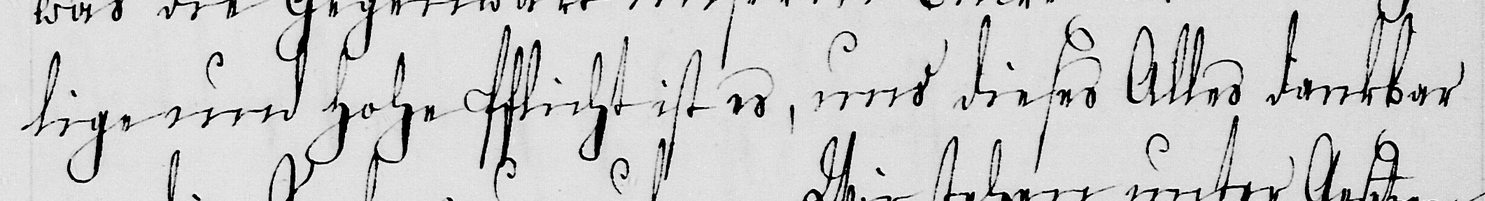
lige und Hohe Pflicht ist es, uns dieses Alles dankbar
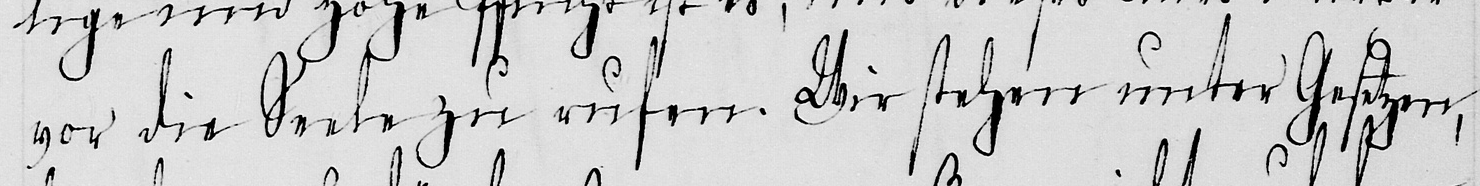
vor die Seele zu rufen. Wir stehen unter Gesetzen,
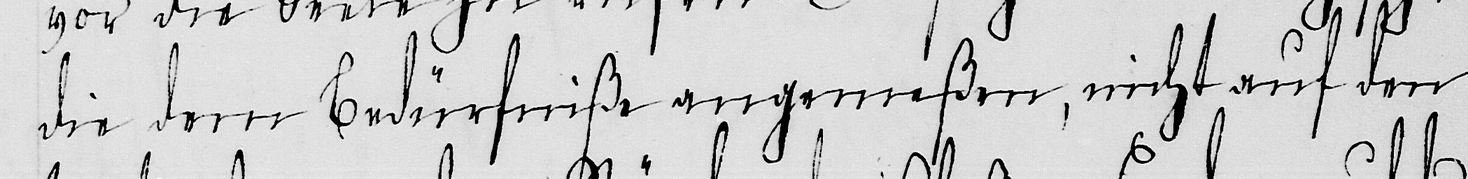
die dem Bedürfniße angemeßen, nicht auf den
